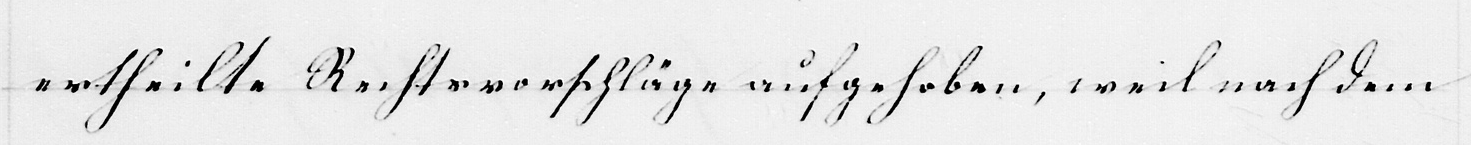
ertheilte Rechtsvorschläge aufgehoben, weil nach dem
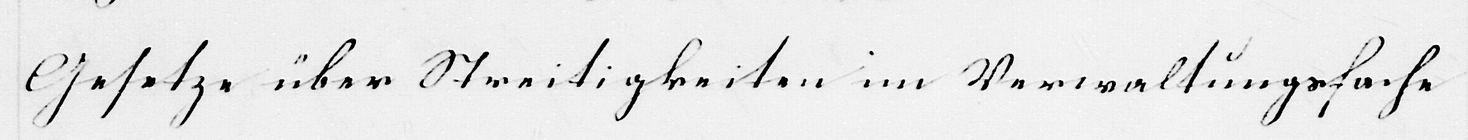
Gesetze über Streitigkeiten im Verwaltungsfache
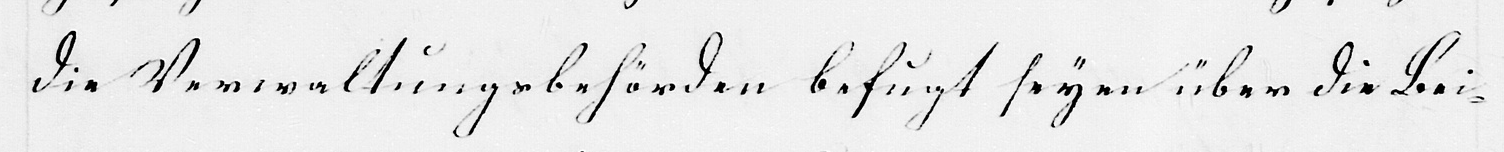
die Verwaltungsbehörden befugt seyen über die Bei¬
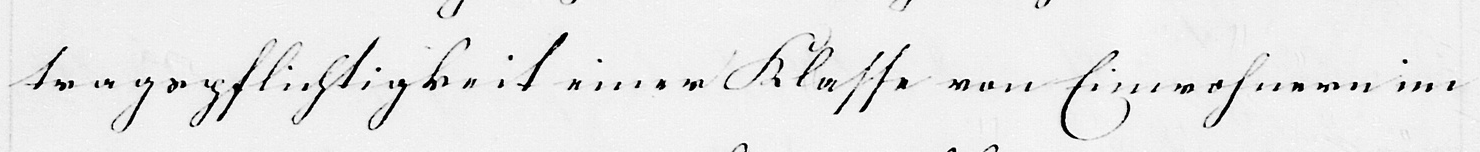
tragspflichtigkeit einer Klasse von Einwohnern im
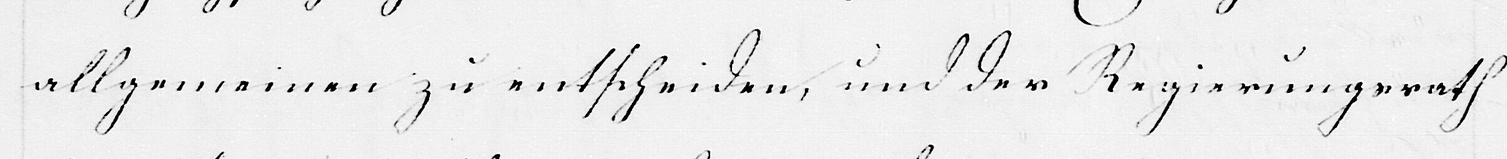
allgemeinen zu entscheiden, und der Regierungsrath
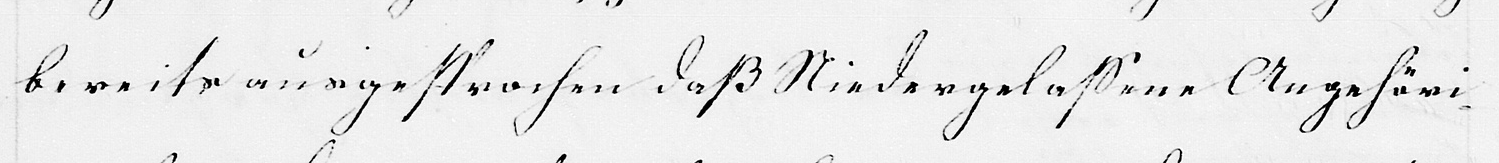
bereits ausgesprochen daß Niedergelaßene Angehöri¬
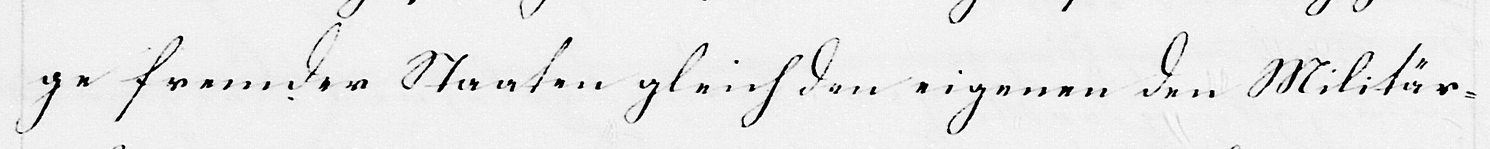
ge fremder Staaten gleich den eigenen den Militär¬
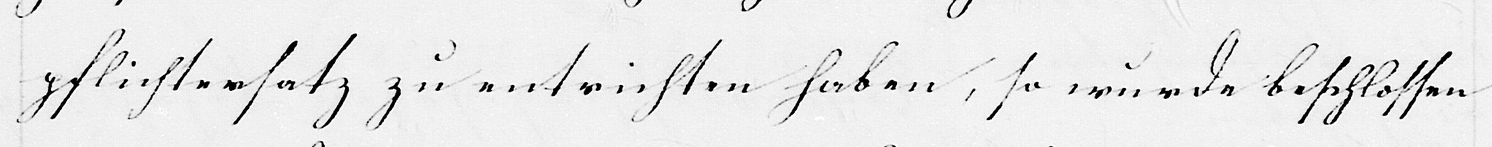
pflichtersatz zu entrichten haben, so wurde beschlossen
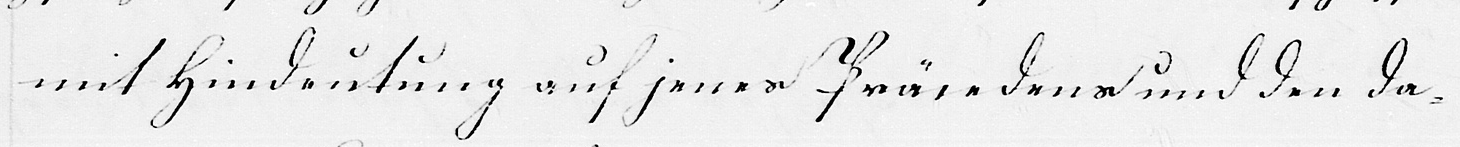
mit Hindeutung auf jenes Präcedens und den da¬
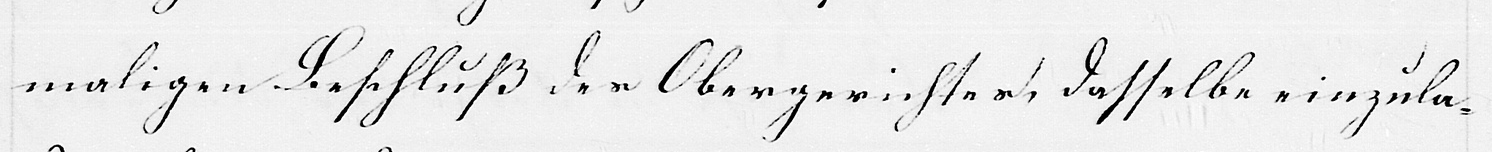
maligen Beschluß des Obergerichtes dasselbe einzula¬
